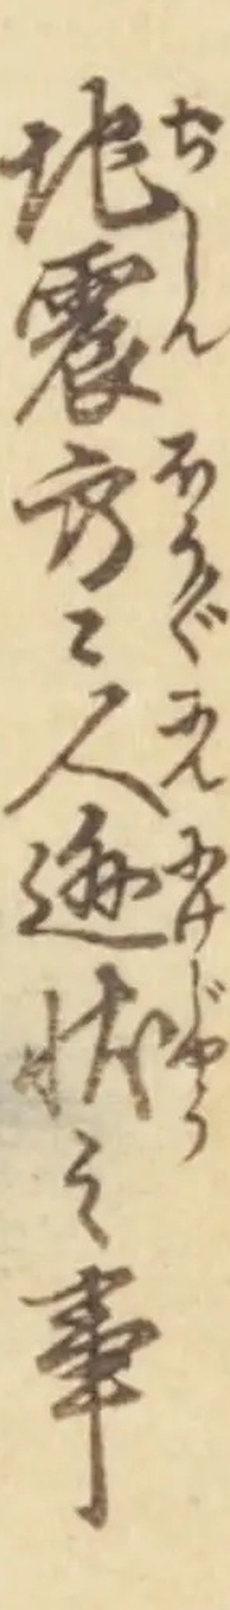地震方々人迯状之事
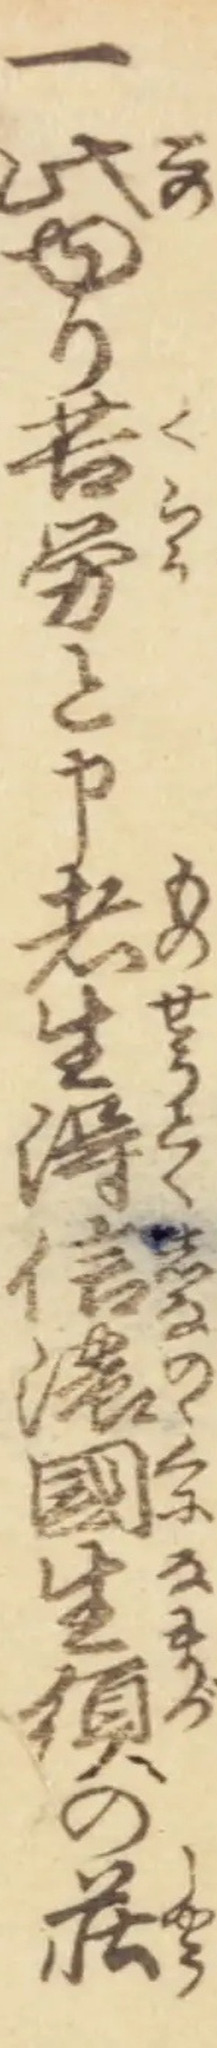一此ゆり苦労と申者生得信濃国生須の荘
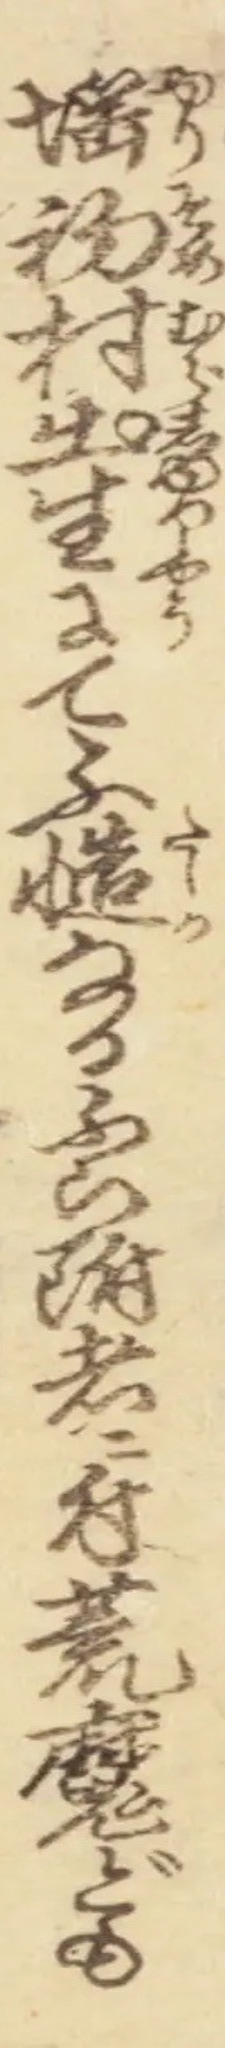揺初村出生にてふ慥なるふら附者ニ付荒魔ども
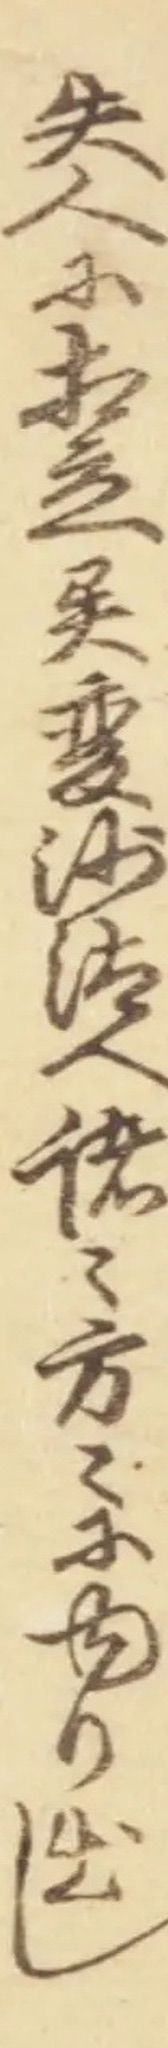失人に相立異変沙汰人諸々方々にゆり出し
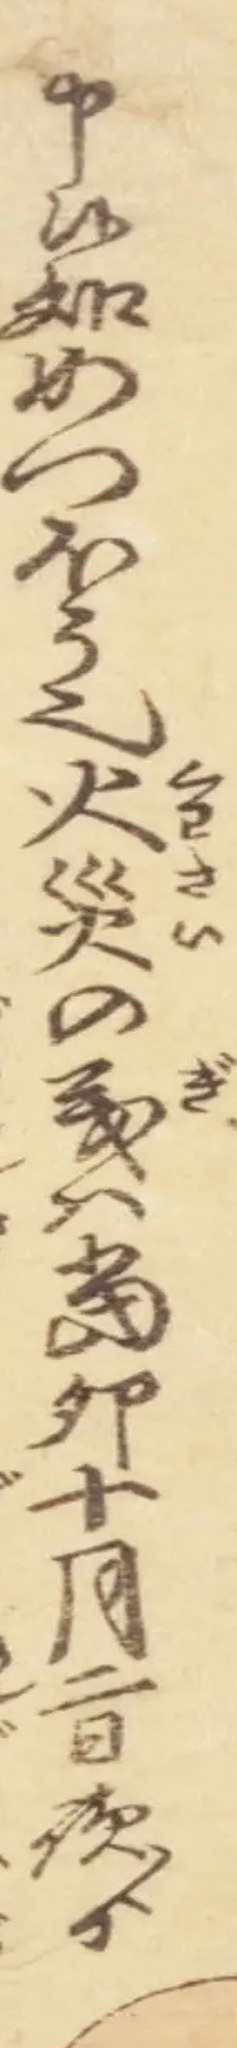申候処めつほう之火災の義は當卯十月二日夜ゟ
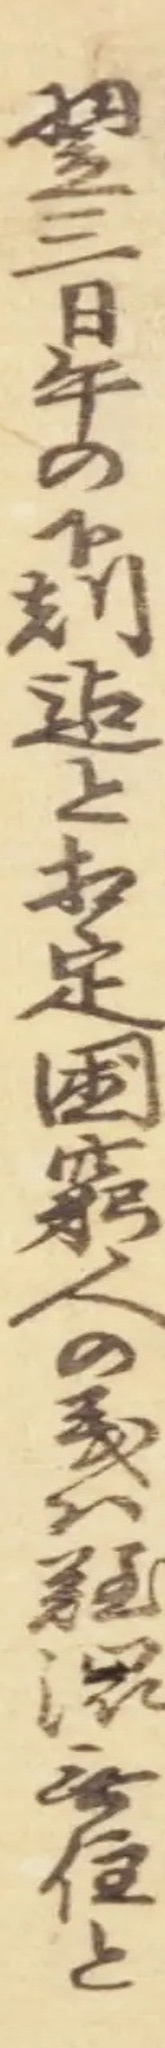翌三日午の下刻迄と相定困窮人の義は難渋無住と
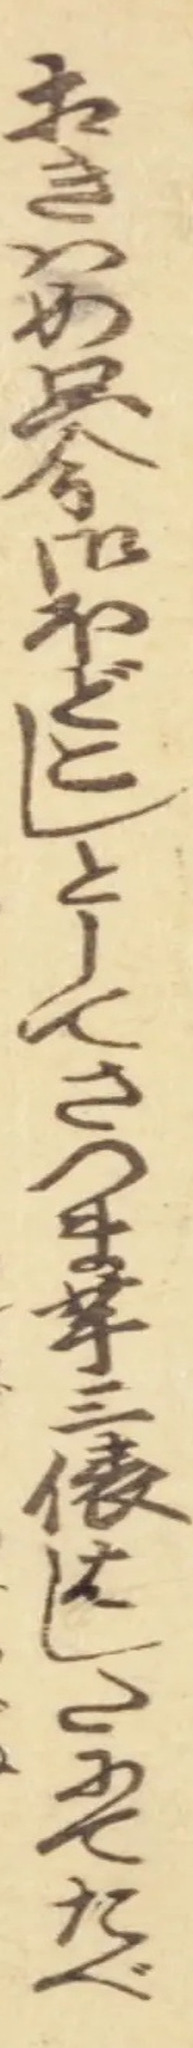相きはめ只今御ほどこしとしてさつま芋三俵はしたにてたべ
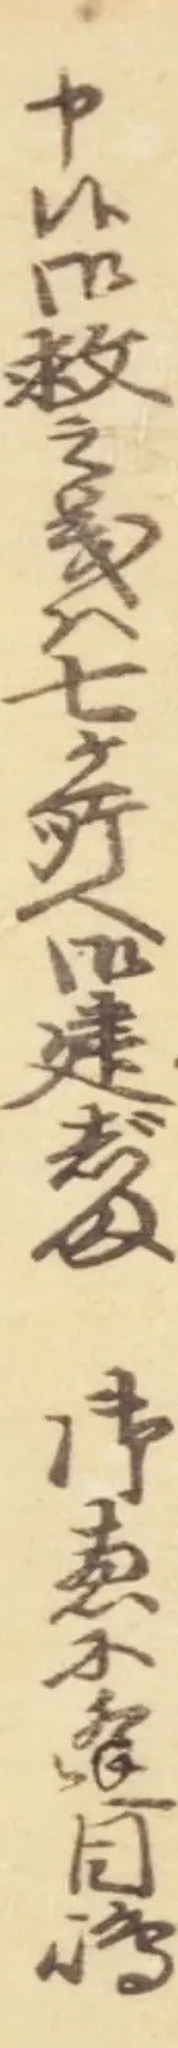申候御救之義は七ヶ所へ御建じま御恵に逢目嶋
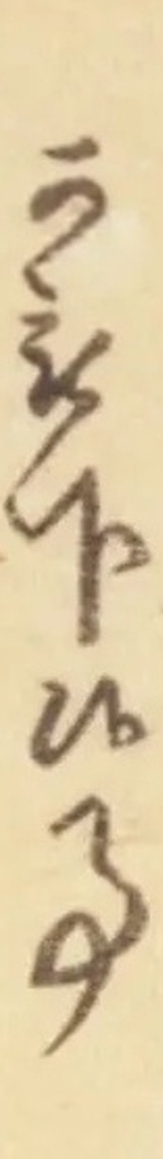可被下候事
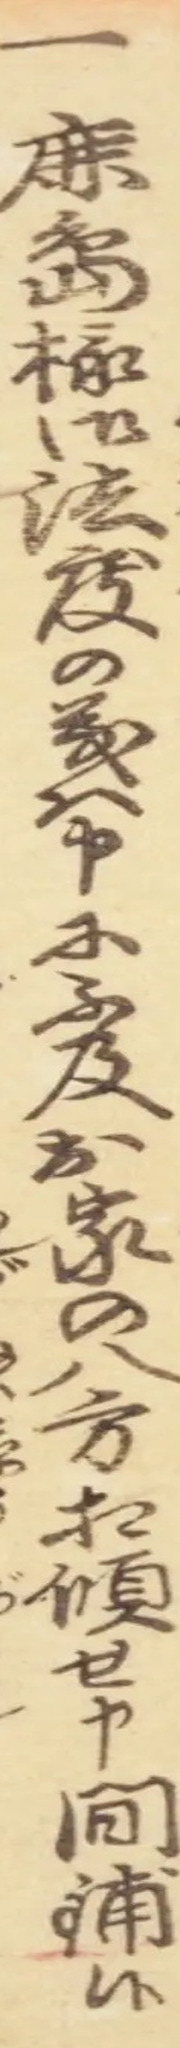一鹿島様御法度の義は申に不及お家の八方相傾せ申間鋪候
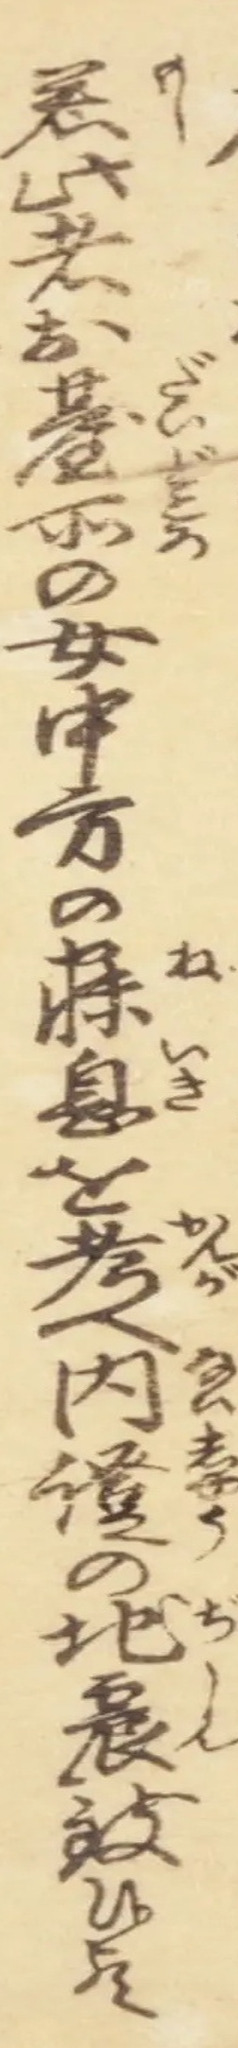若此者お臺所の女中方の寝息を考へ内證の地震致候歟
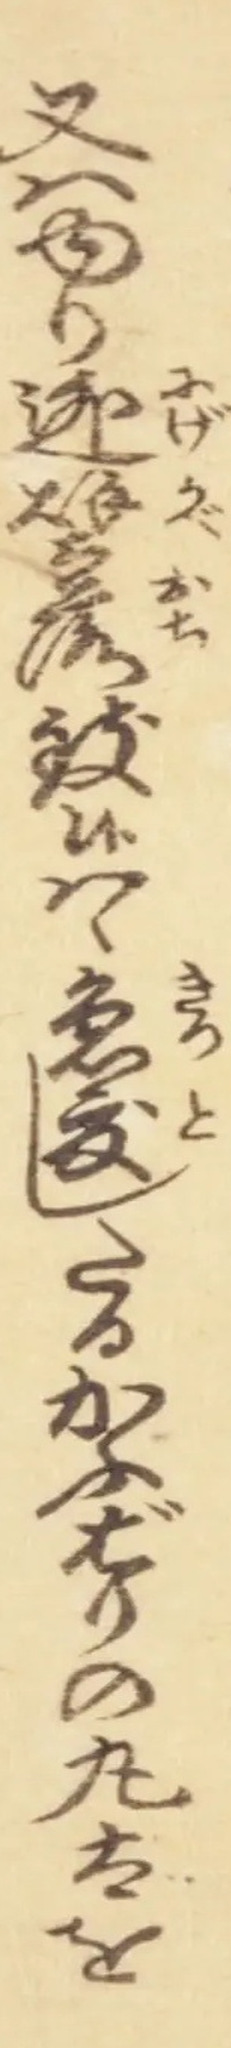又はゆり逃壁落致候はゝ急度したるかふばりの丸太を
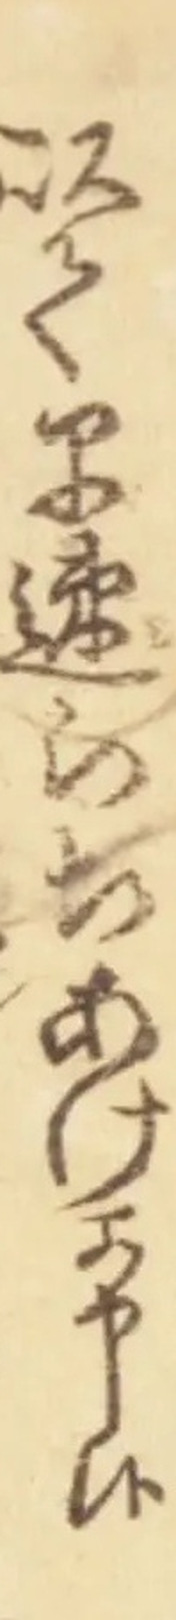以て早速らちあけ可申候
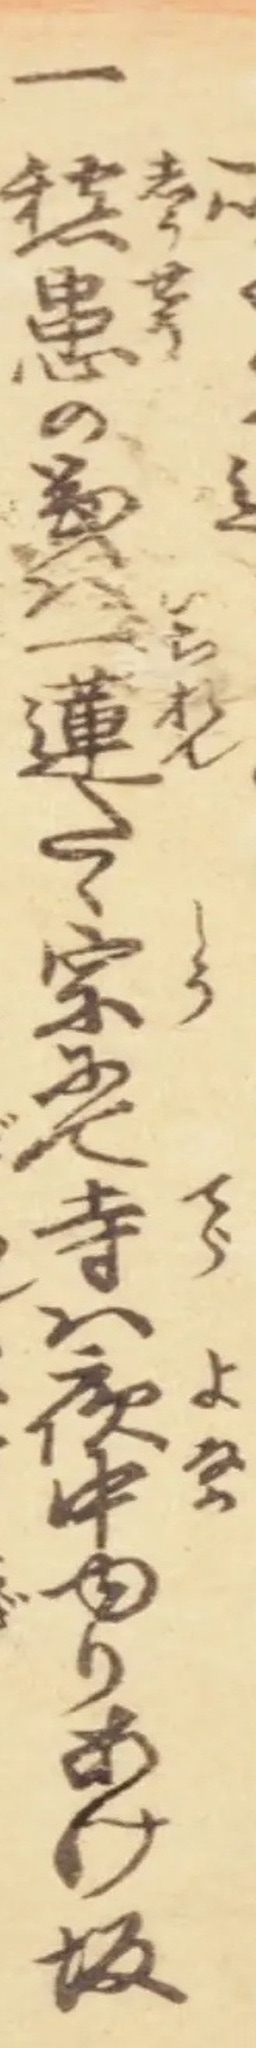一愁患の義は一蓮たく宗にて寺は夜中ゆりあけ坂
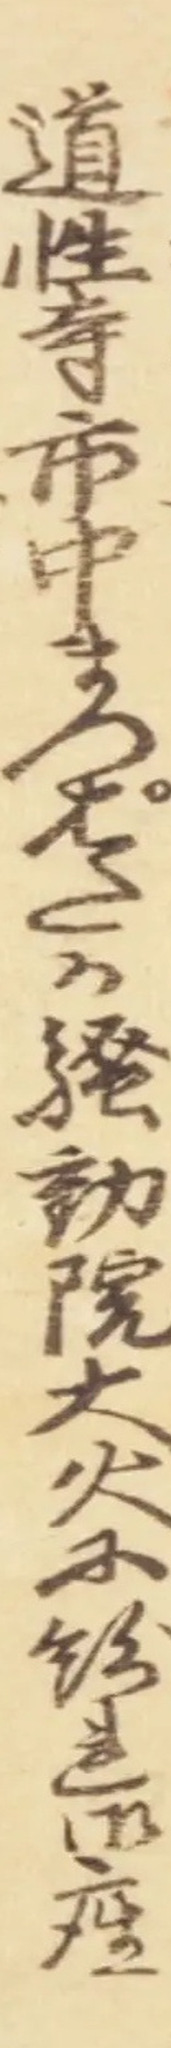道性寺市中まつぱたか騒動院大火に紛れ御座
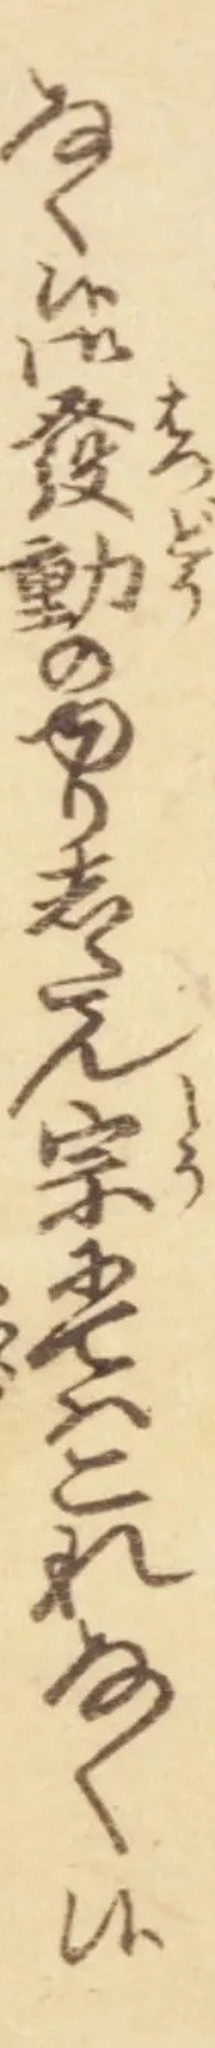なく候御發動のゆりしたん宗にてはこれなく候
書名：地震方々人迯状之事
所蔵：国立国会図書館 National Diet Library, JAPAN
